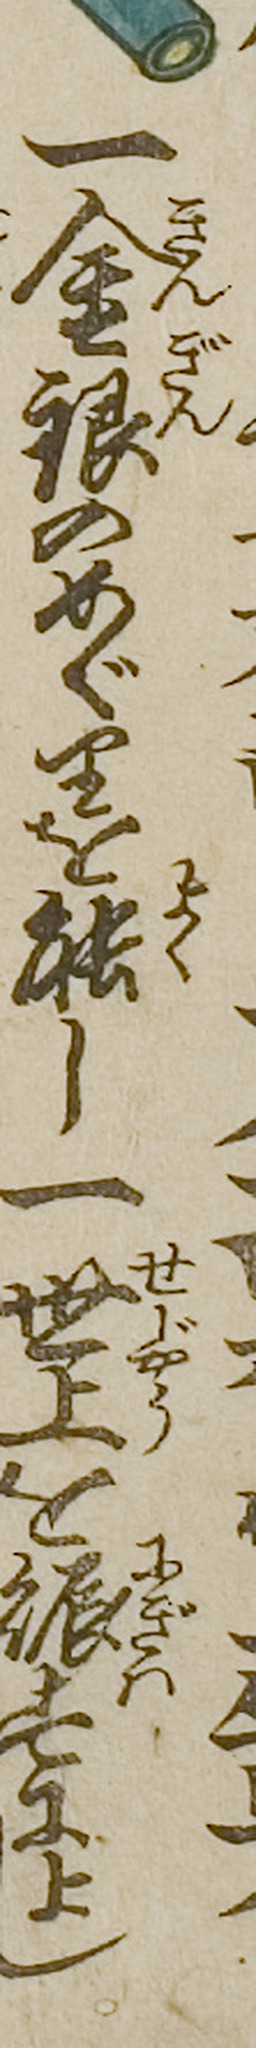一金銀のめぐりを能し一世上を賑すによし
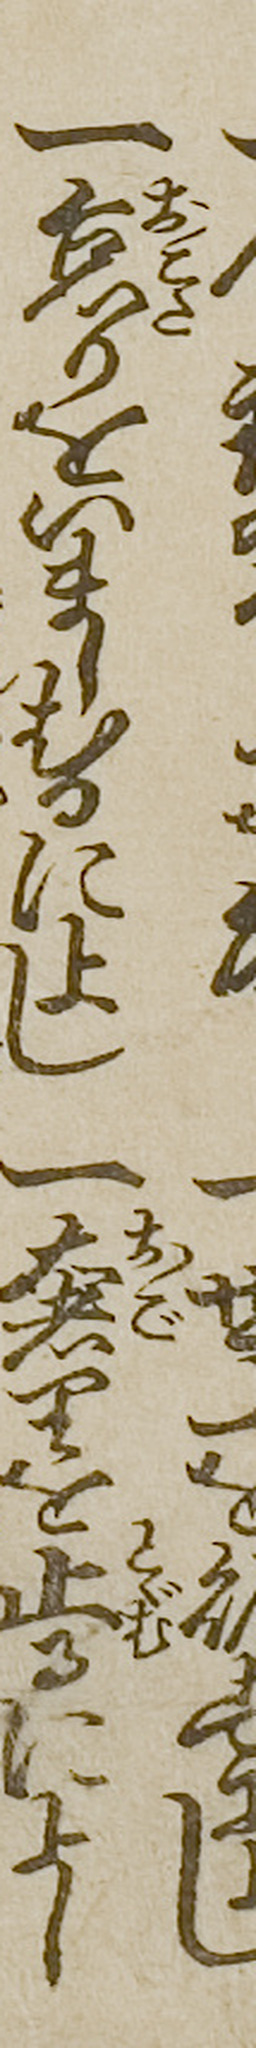一怠りをいましむるによし一奢りを止るによし
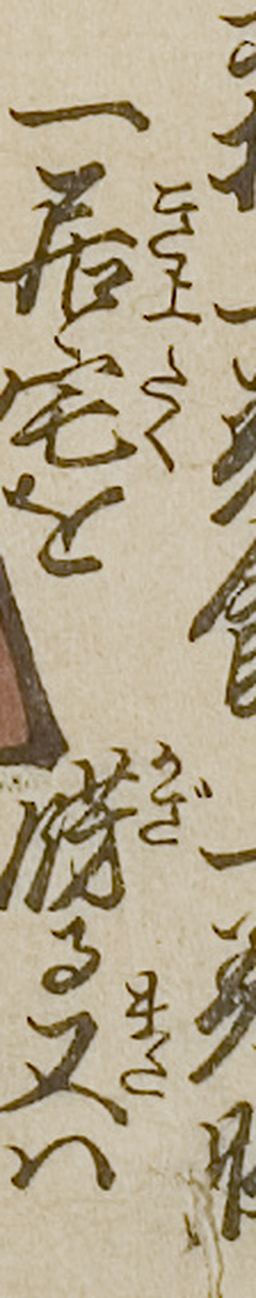一居宅を餝る又は
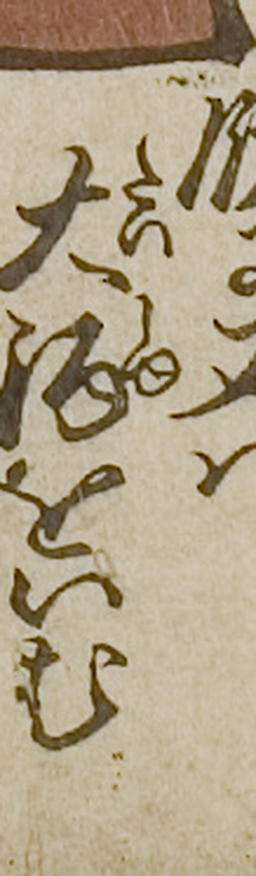大酒をいむ
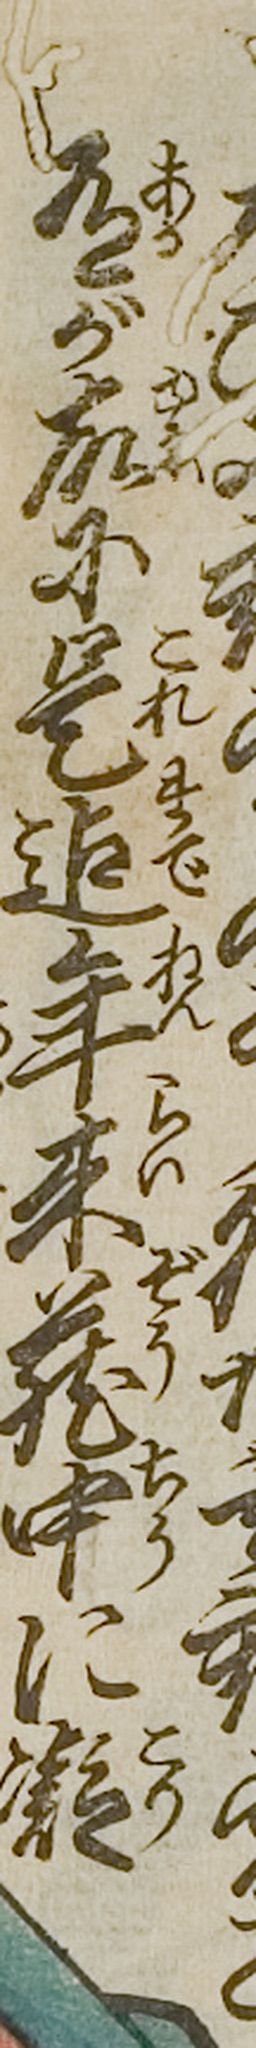有が故に是迠年来蔵中に凝
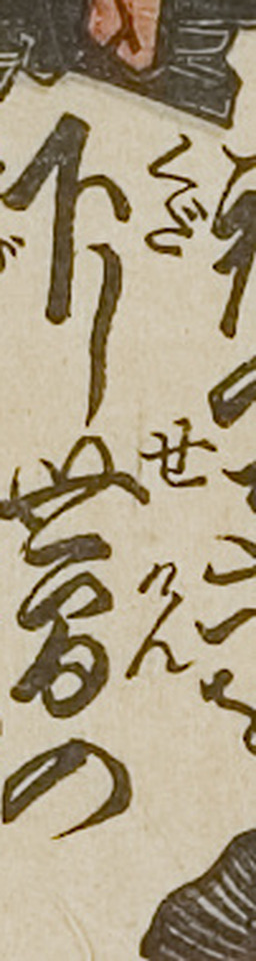下し世間の
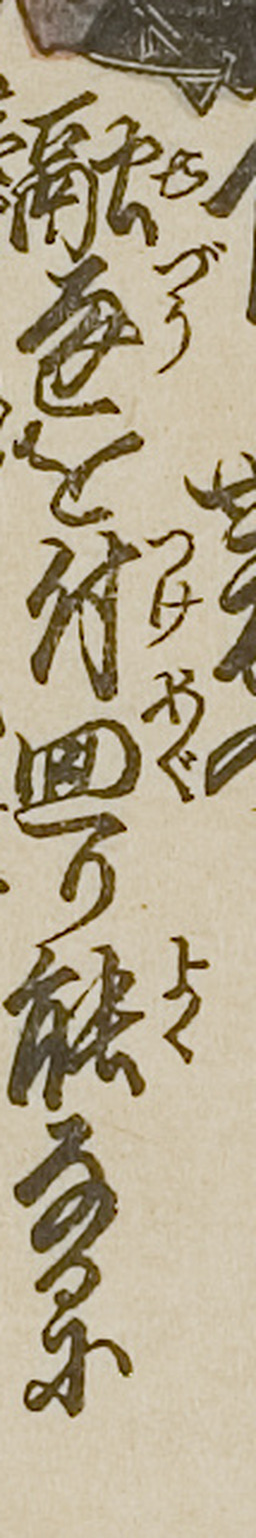融通を付廻り能なるに
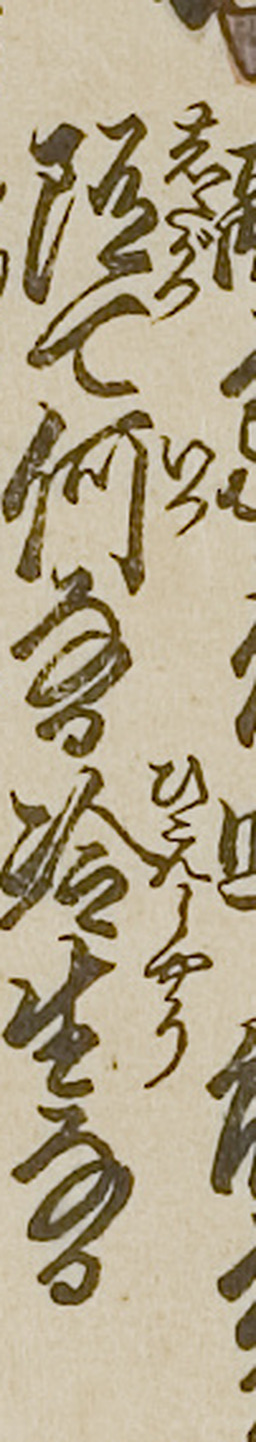随て何なる冷生なる
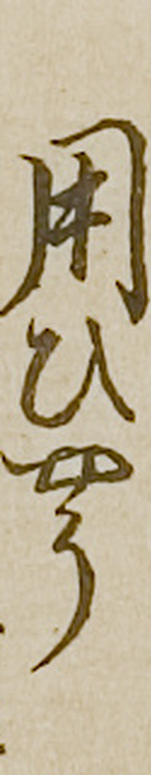用ひやう
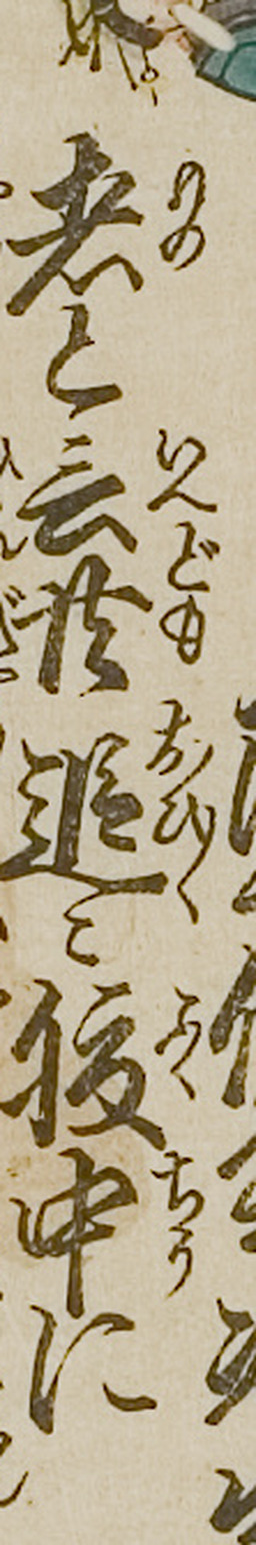者と言共追々腹中に
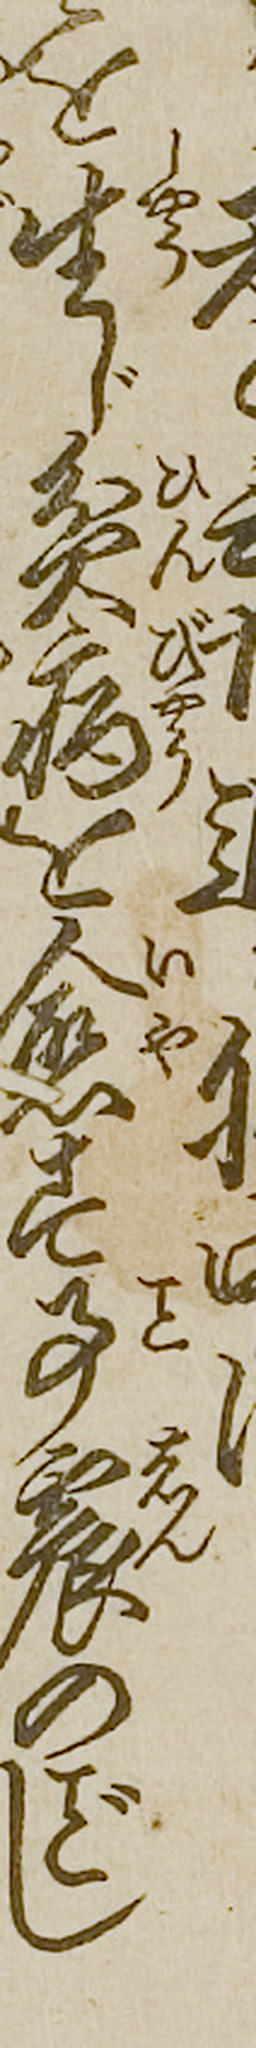暖みを生じ貧病を愈す事震のごとし
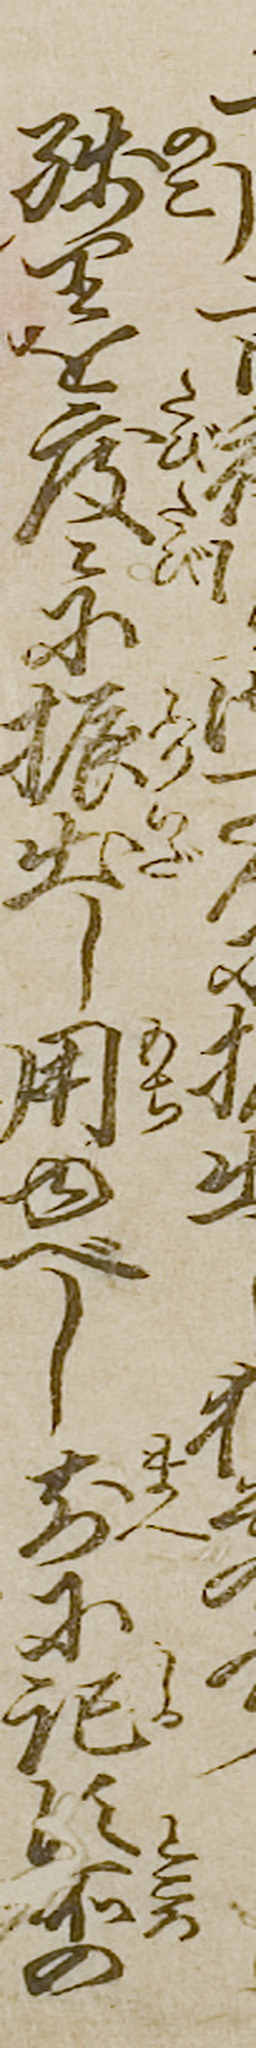残りを度々に振出し用ゆべし前に記す所の
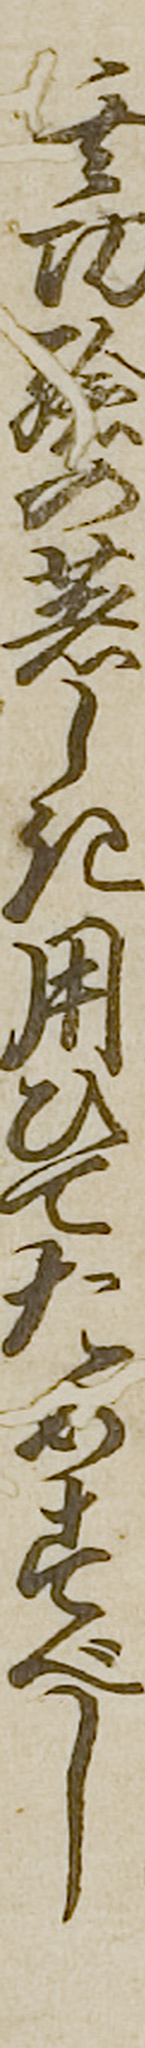其功験の著しき用ひてためすべし
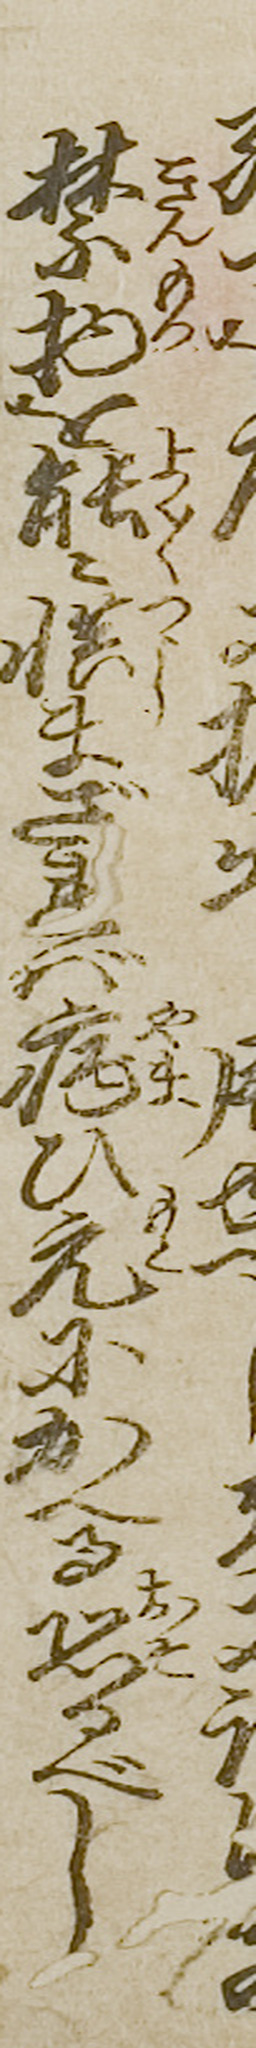禁物を能々慎まざれば病ひ元にかへる恐るべし
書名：振出し鯰薬
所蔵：東京大学総合図書館 General Library in the University of Tokyo, JAPAN
